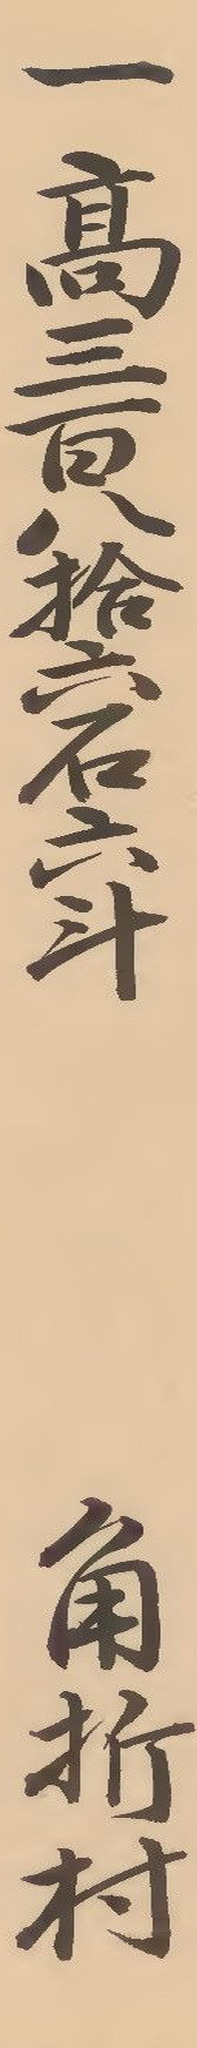一高三百八拾六石六斗角折村
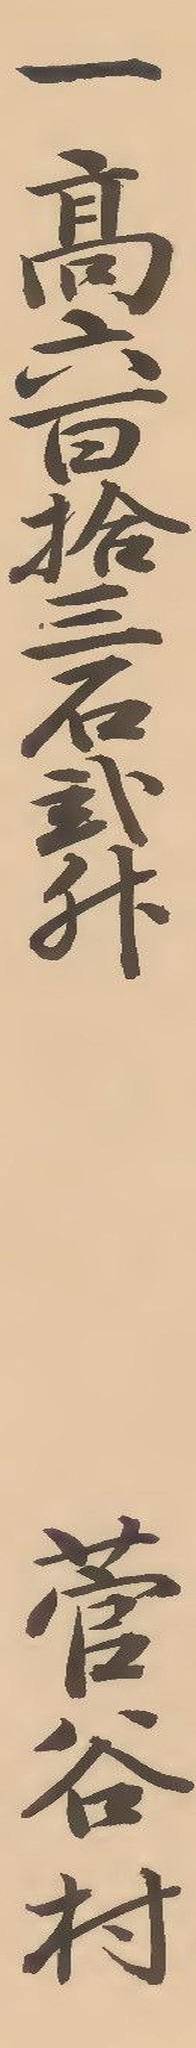一高六百拾三石弐升菅谷村
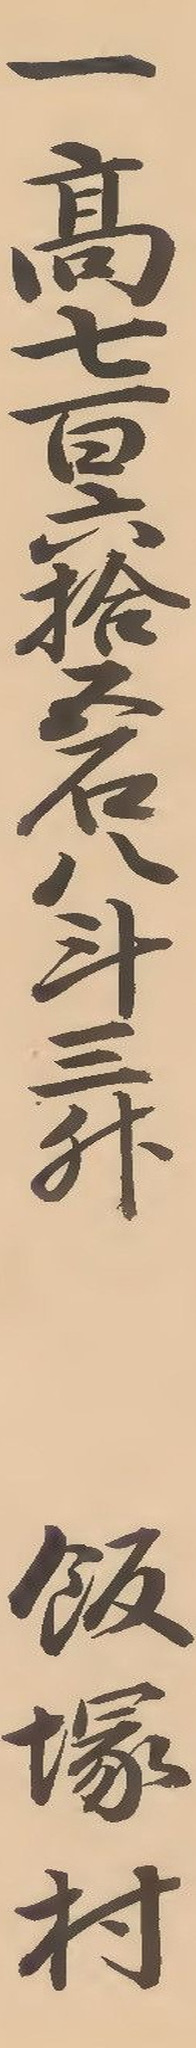一高七百六拾五石八斗三升飯塚村
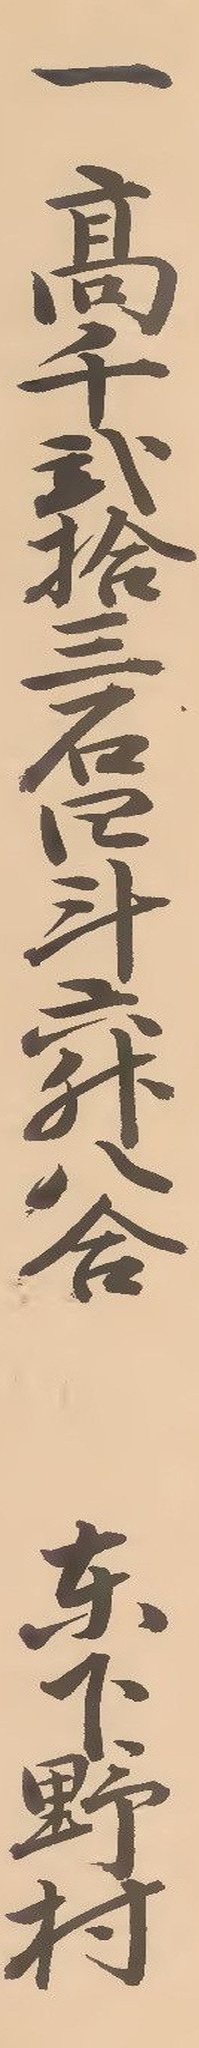一高千弐拾三石四斗六升八合東下野村
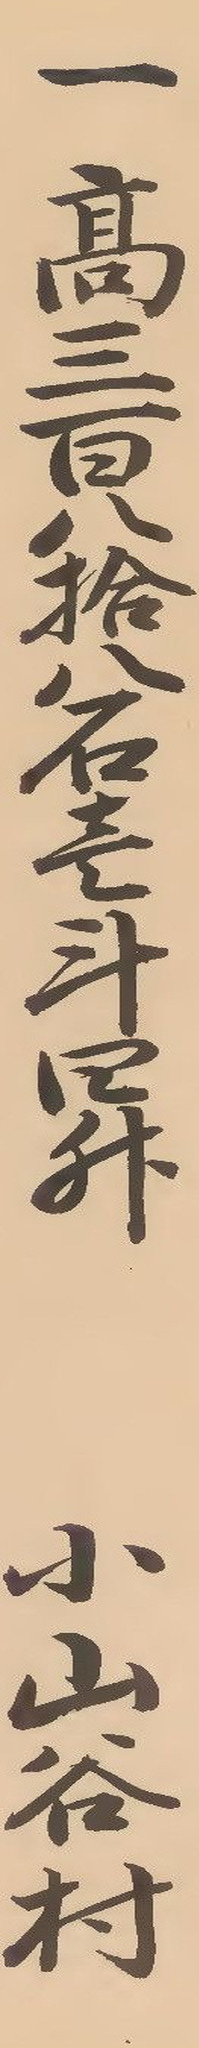一高三百八拾八石壱斗四升小山谷村
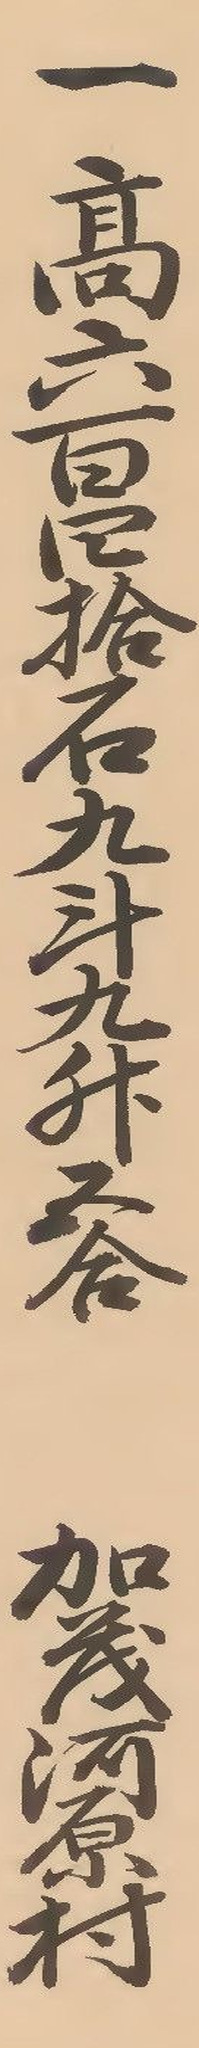一高六百四拾石九斗九升五合加茂河原村
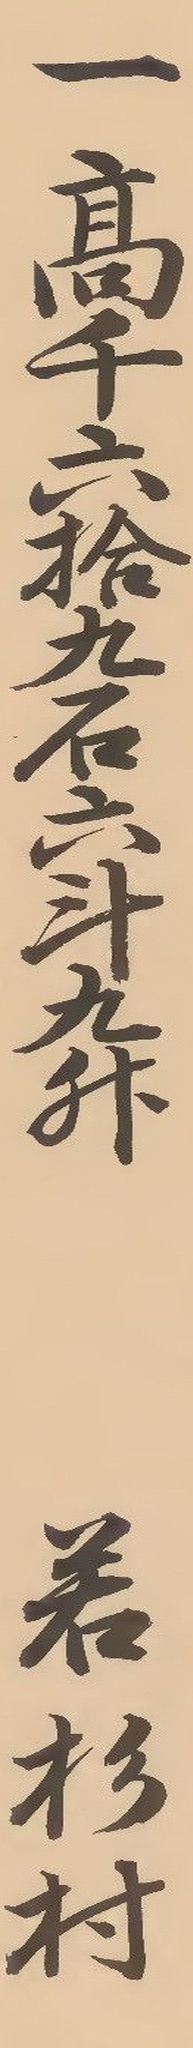一高千六拾九石六斗九升若杉村

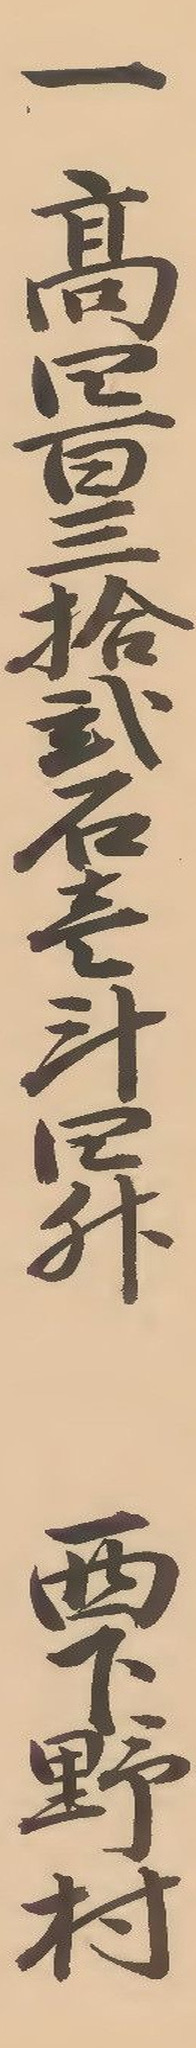一高四百三拾弐石壱斗四升西下野村
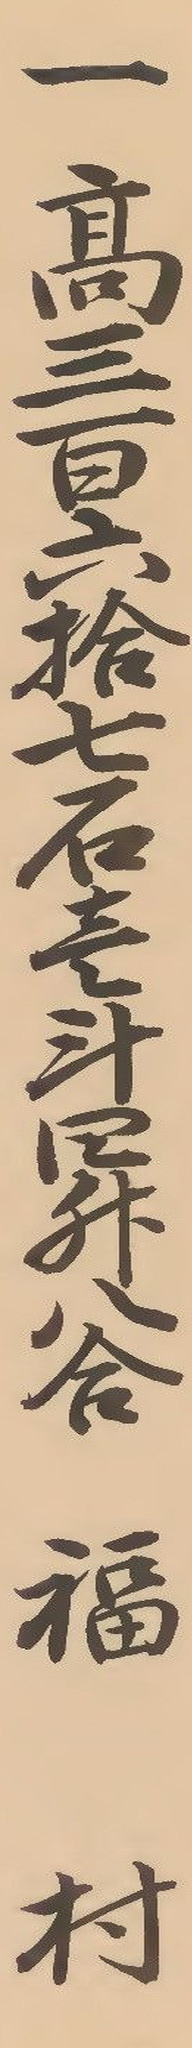一高三百六拾七石壱斗四升八合福村
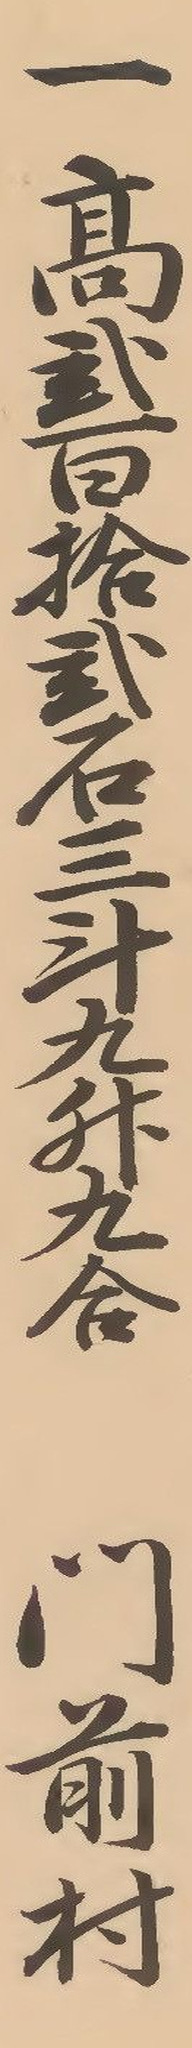一高弐百拾弐石三斗九升九合門前村
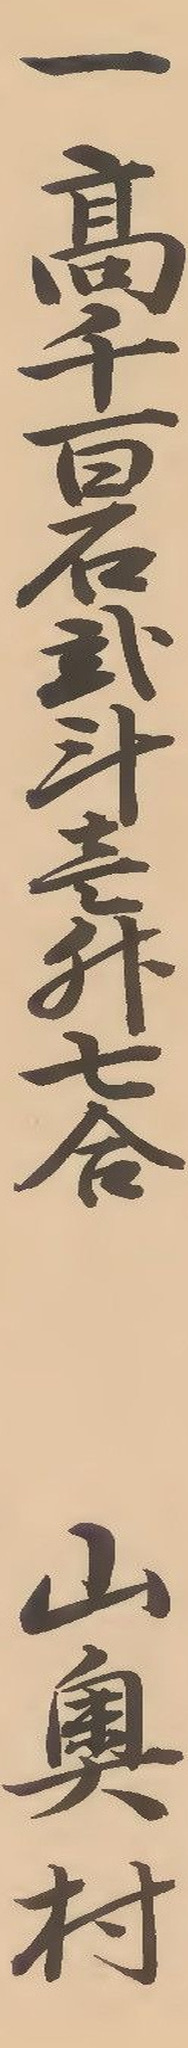一高千百石弐斗壱升七合山奥村
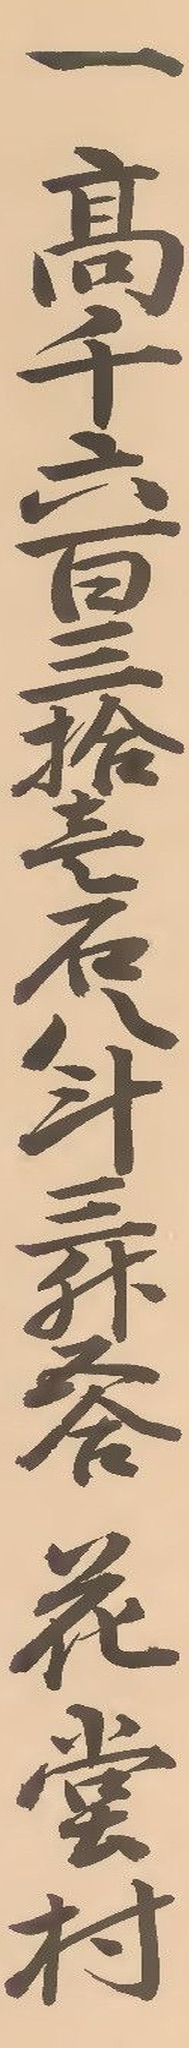一高千六百三拾壱石八斗三升五合花堂村
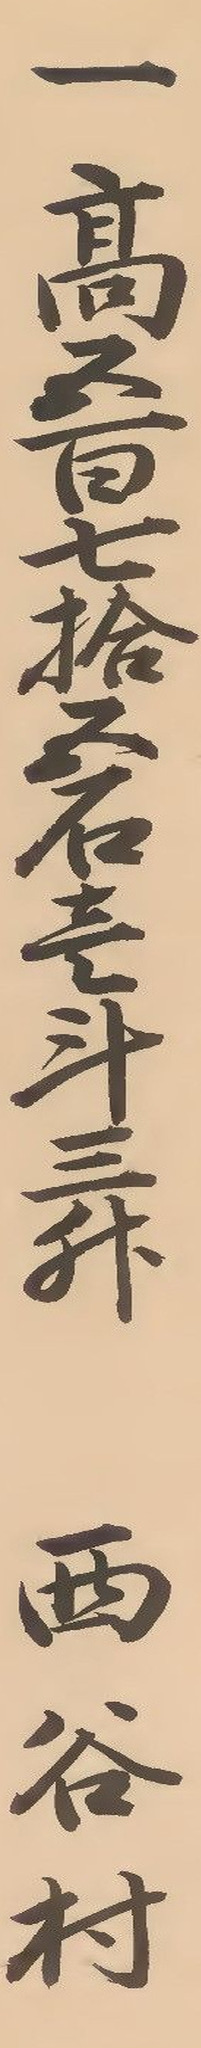一高五百七拾五石壱斗三升西谷村
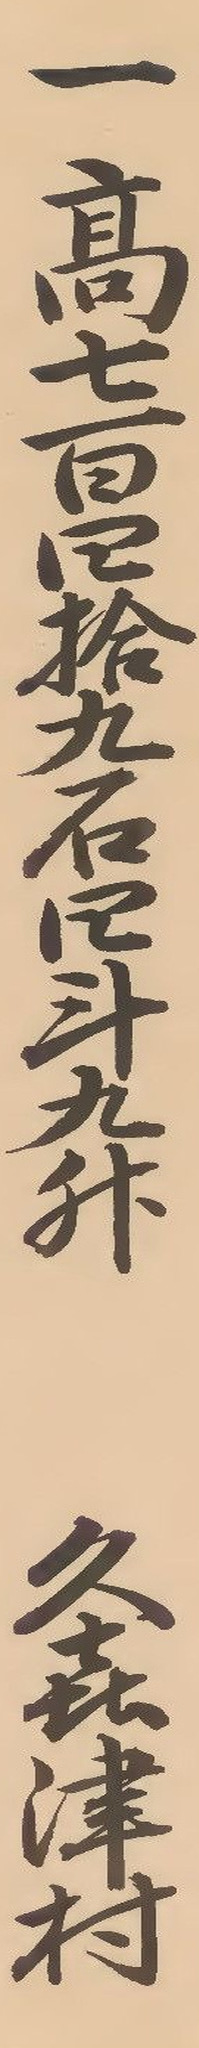一高七百四拾九石四斗九升久喜津村
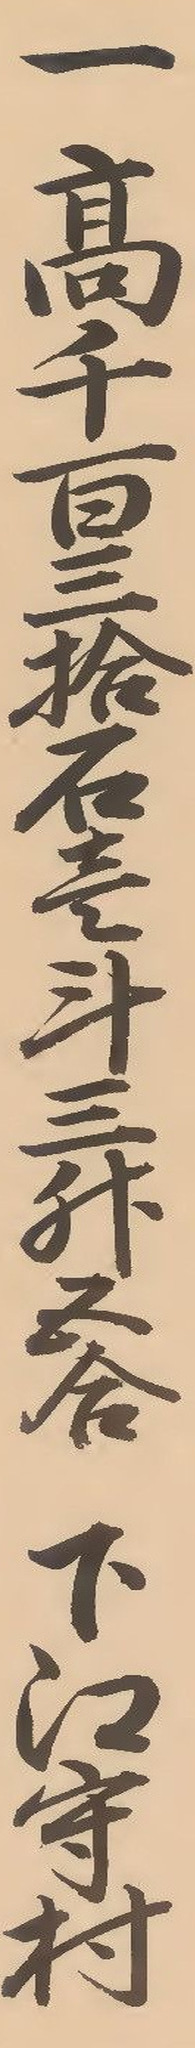一高千百三拾石壱斗三升五合下江守村

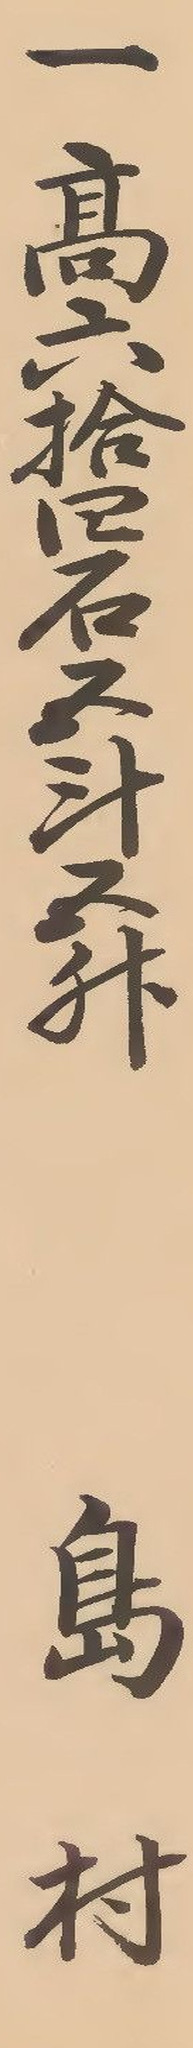一高六拾四石五斗五升島村
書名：越前国郷帳
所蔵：国立公文書館 National Archives of Japan
